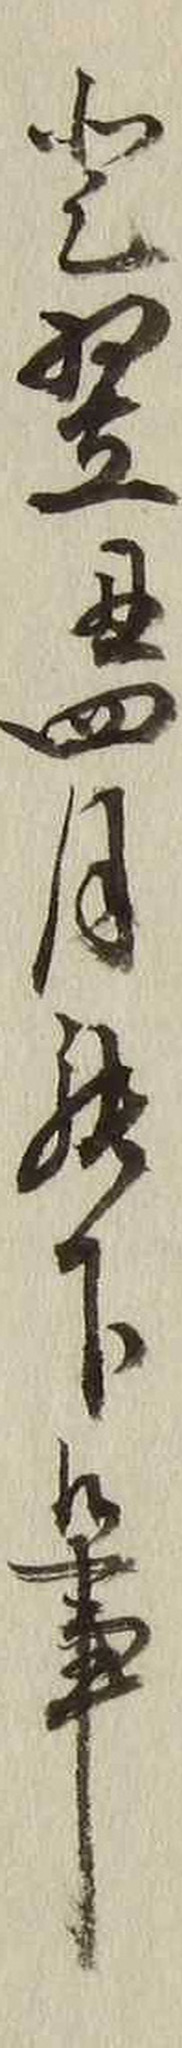登翌丑四月罷下候事
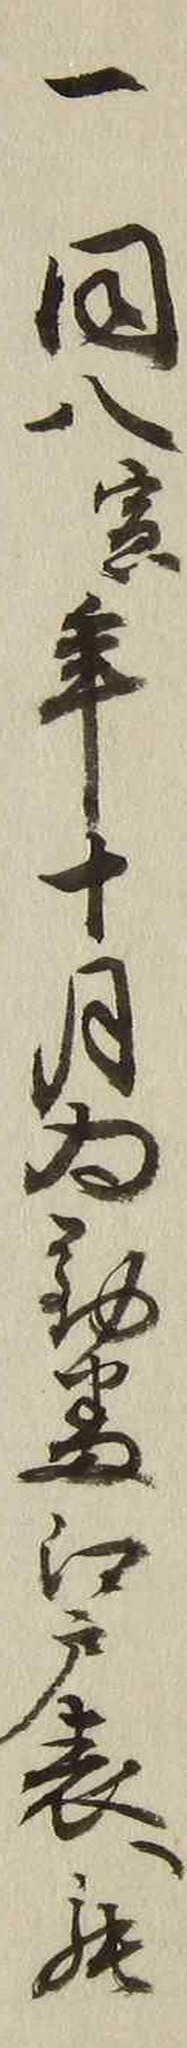一同八寅年十月為勤番江戸表へ罷
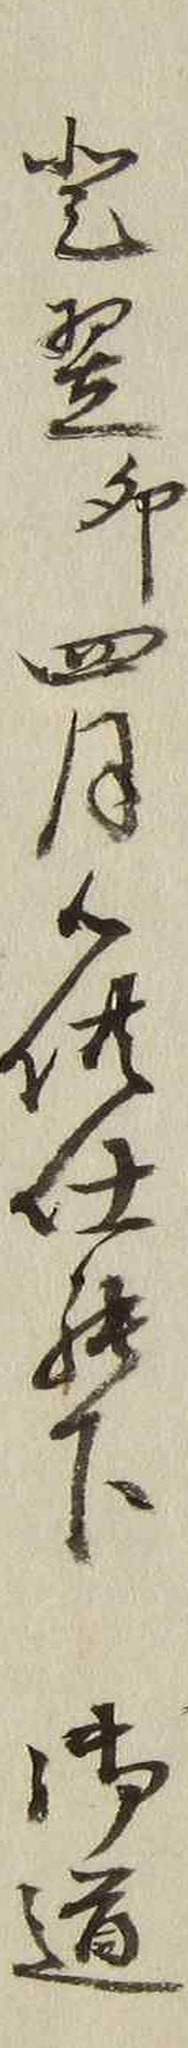登翌卯四月御供仕罷下御道
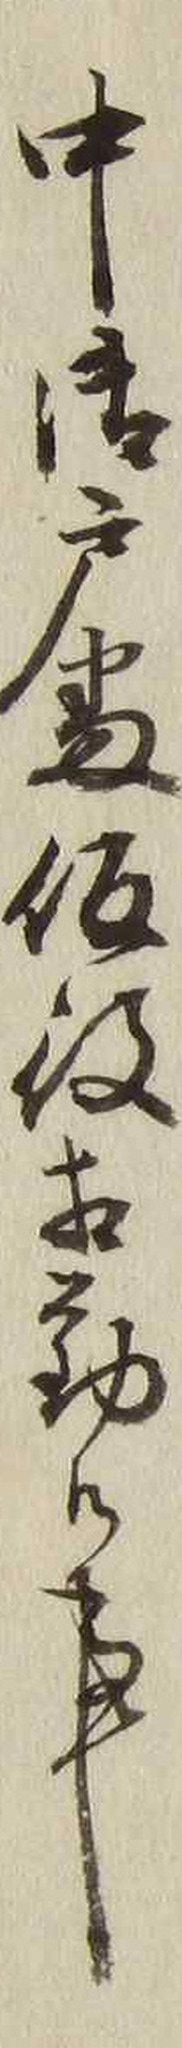中御戸番仮役相勤候事
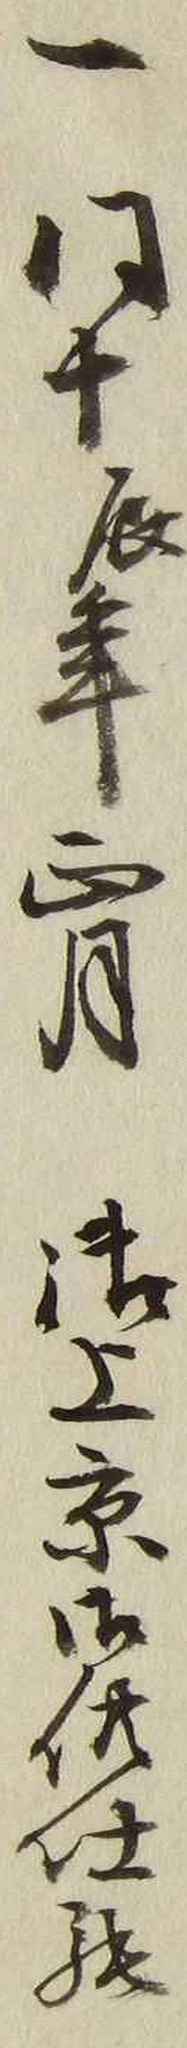一同十辰年正月御上京御供仕罷

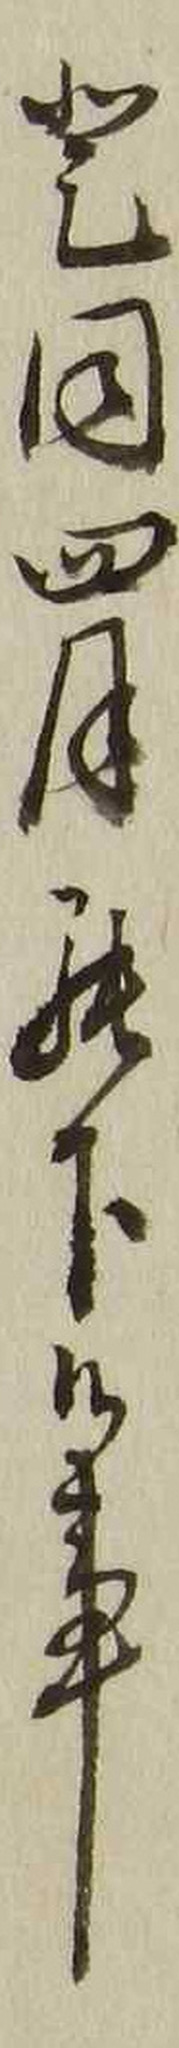登同四月罷下候事
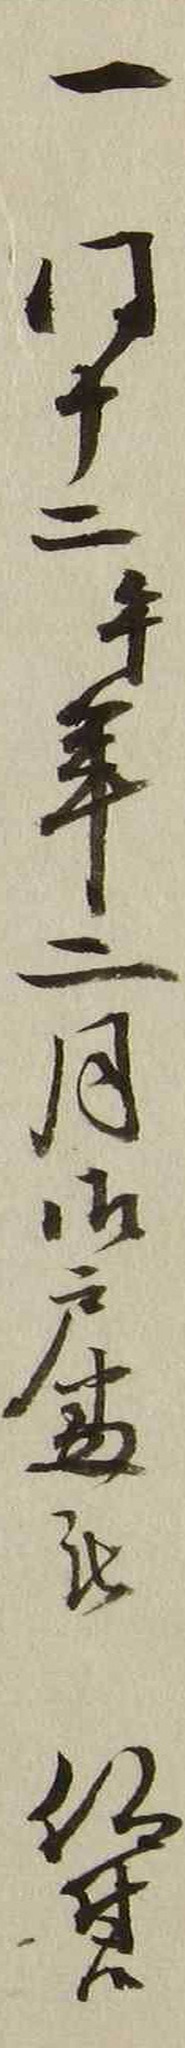一同十二午年二月御戸番被仰付候
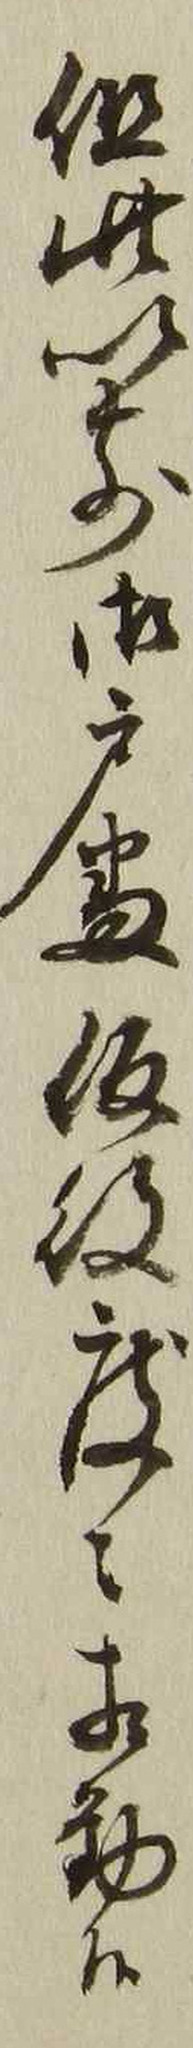但此以前御戸番仮役度々相勤候
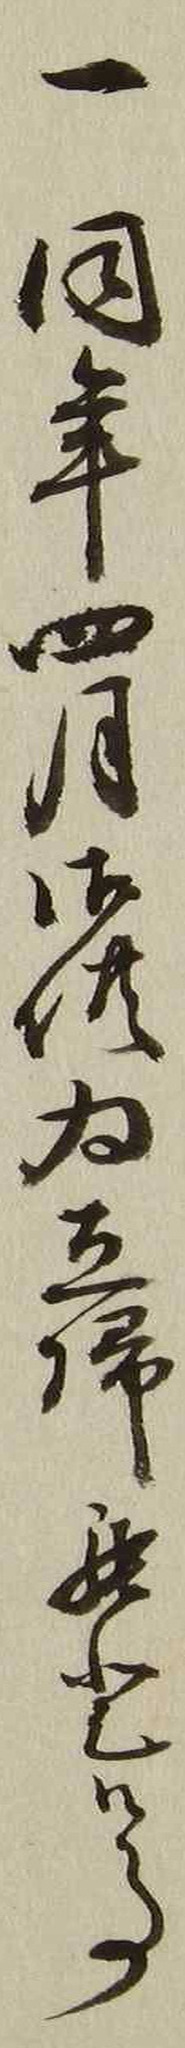一同年四月御供為立帰罷登候事
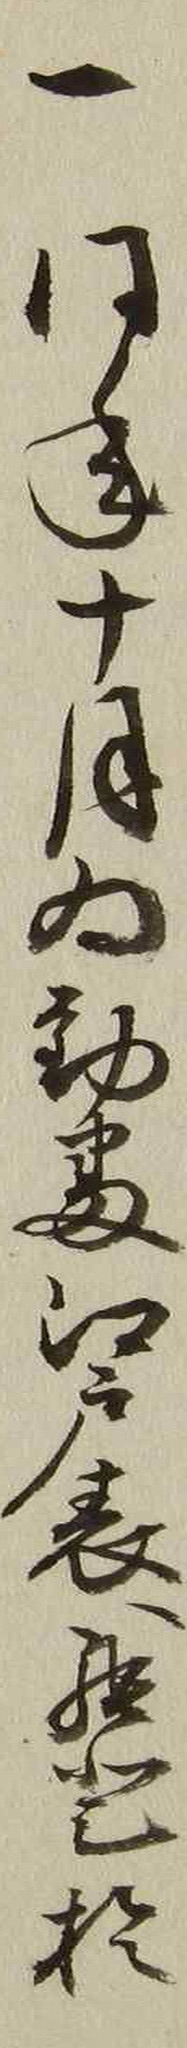一同年十月為勤番江戸表へ罷登於
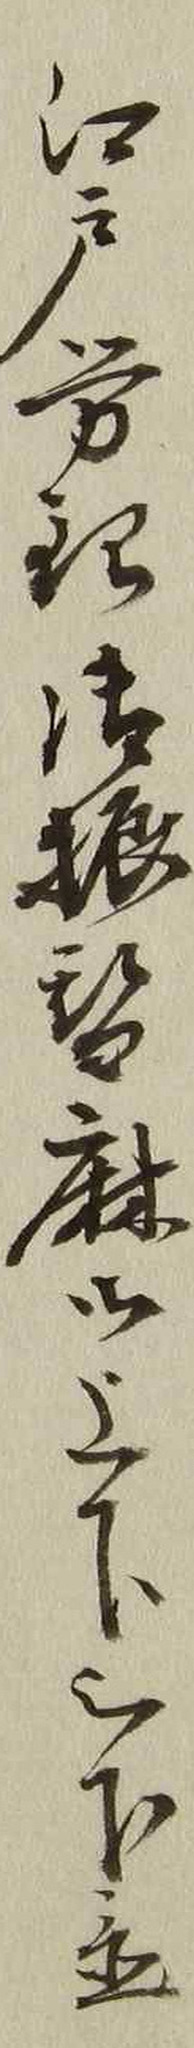江戸労銀御振替麻御上下被下置
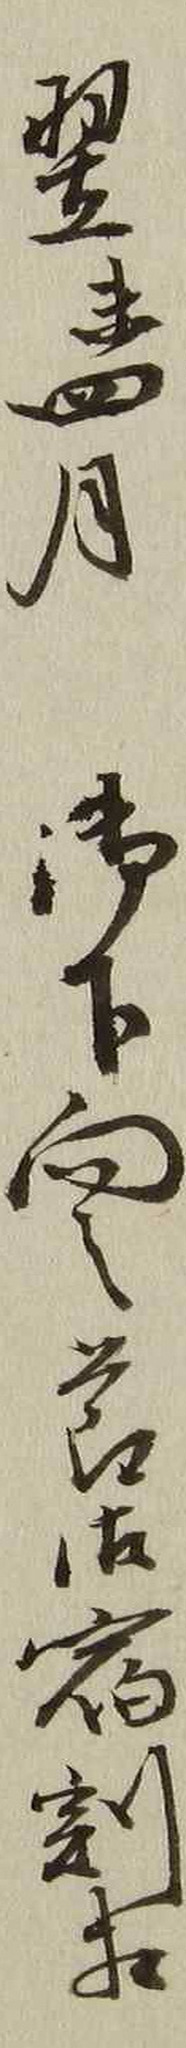翌未四月御下向之節御宿割相
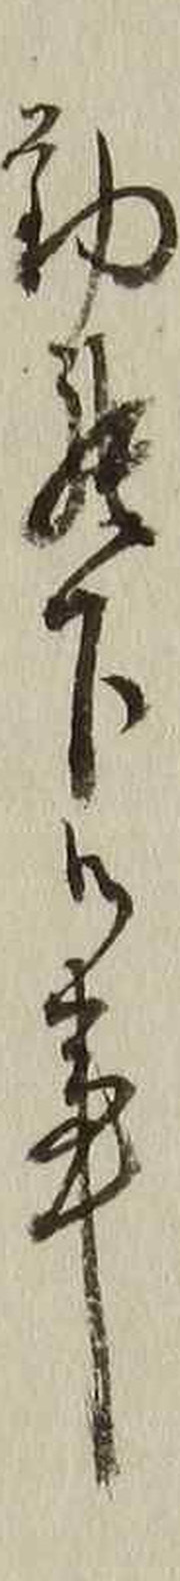勤罷下候事
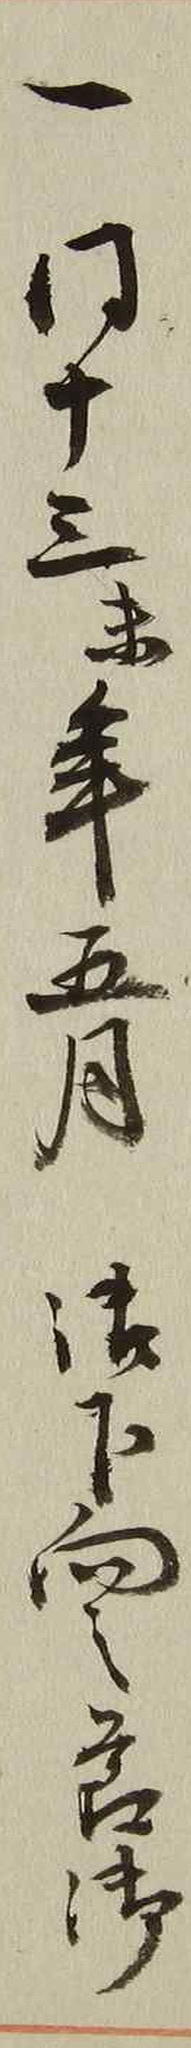一同十三未年五月御下向之節御
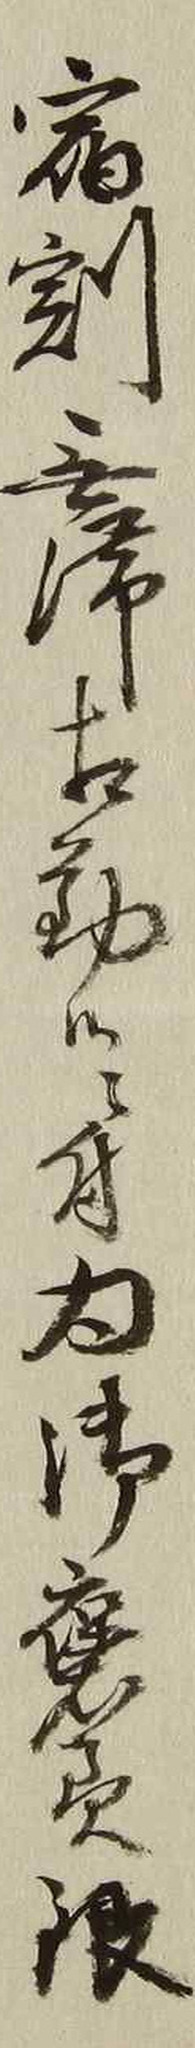宿割無滞相勤候ニ付為御褒美銀
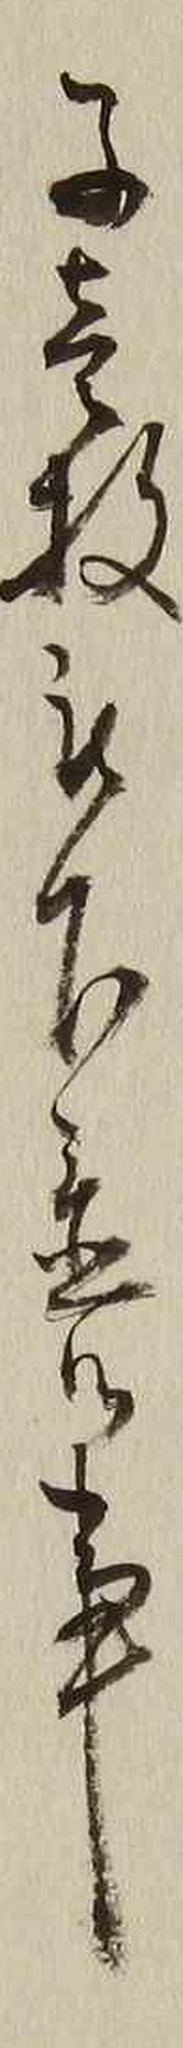子壱枚被下置候事
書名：諸士系譜　巻之23　い之部23
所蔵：会津若松市立会津図書館
